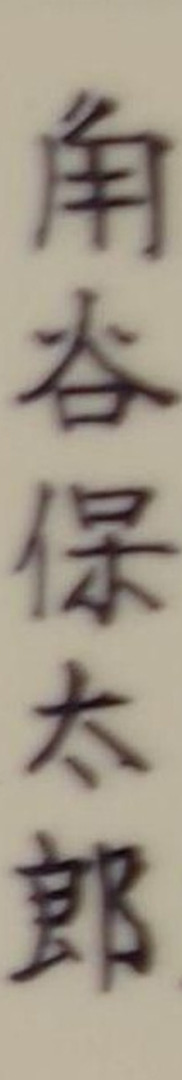角谷保太郎
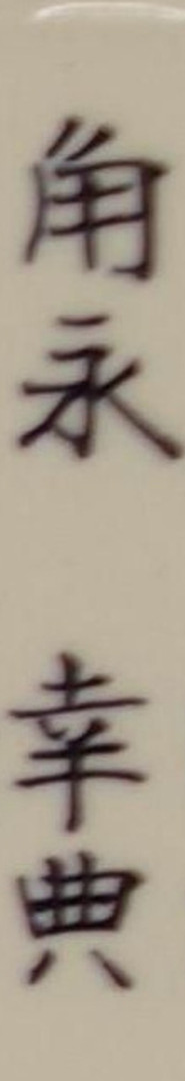角永幸典
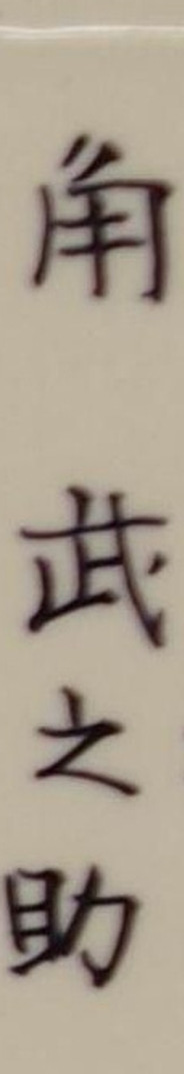角武之助
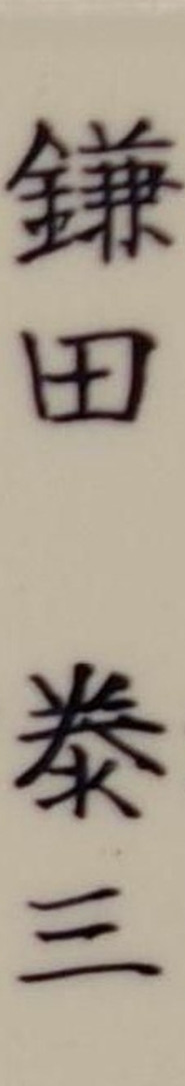鎌田泰三
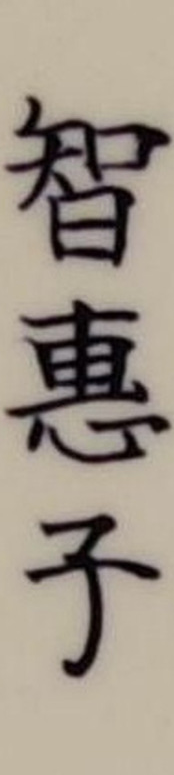智恵子
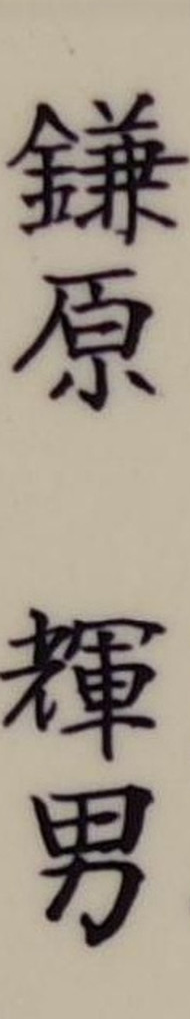鎌原輝男
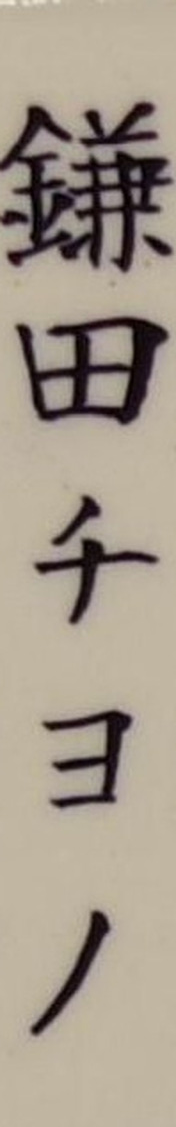鎌田チヨノ
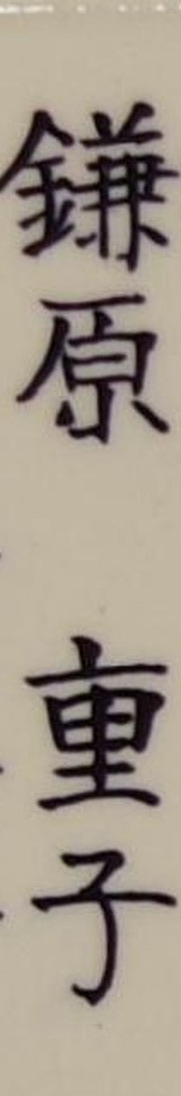鎌原重子
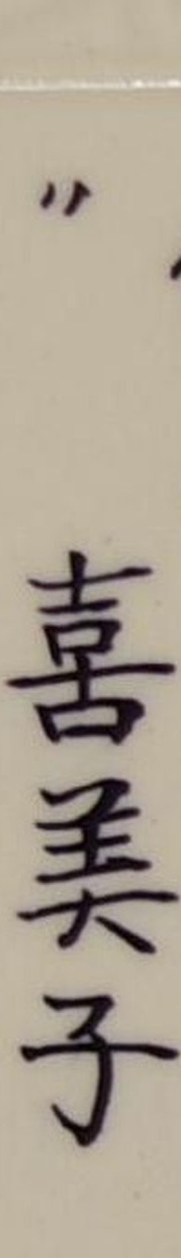喜美子
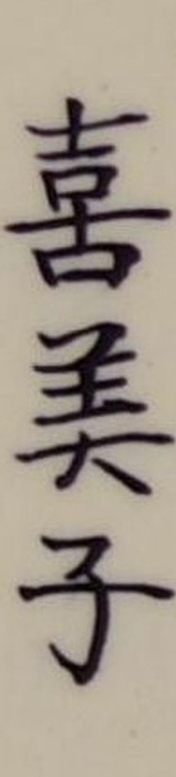喜美子
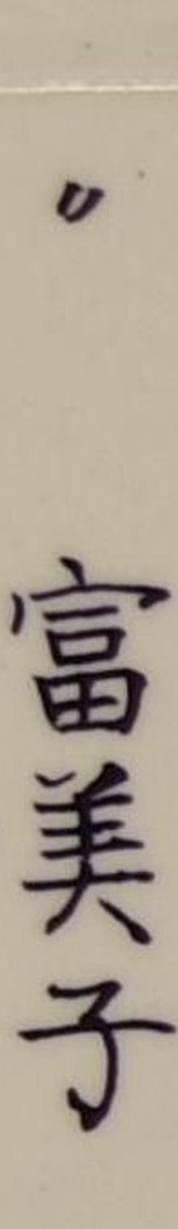富美子
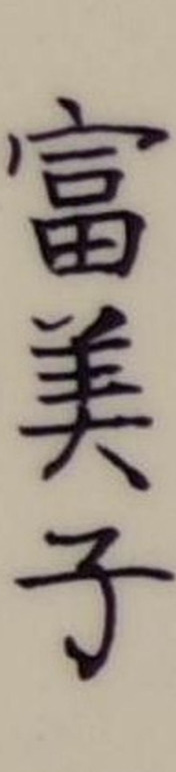富美子

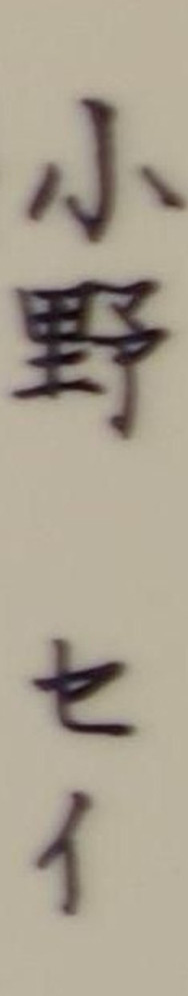小野セイ
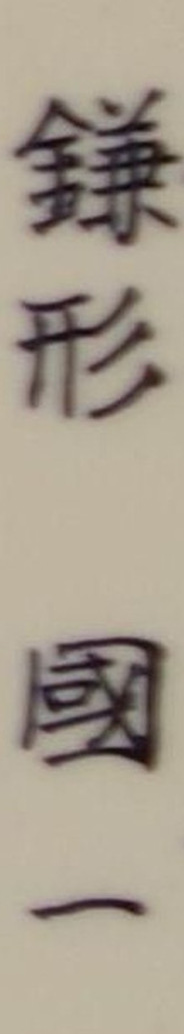鎌形國一
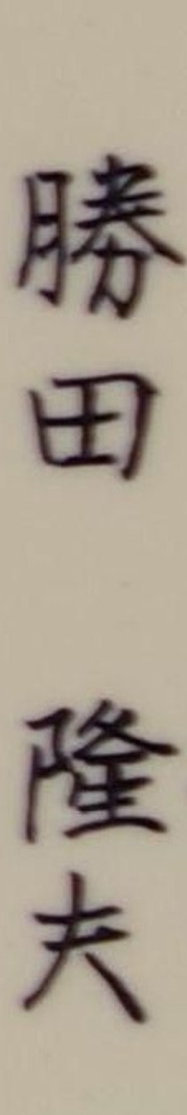勝田隆夫
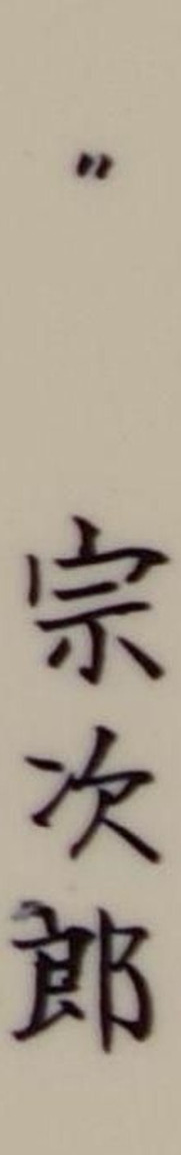宗次郎
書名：M~S
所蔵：高野山金剛峯寺
